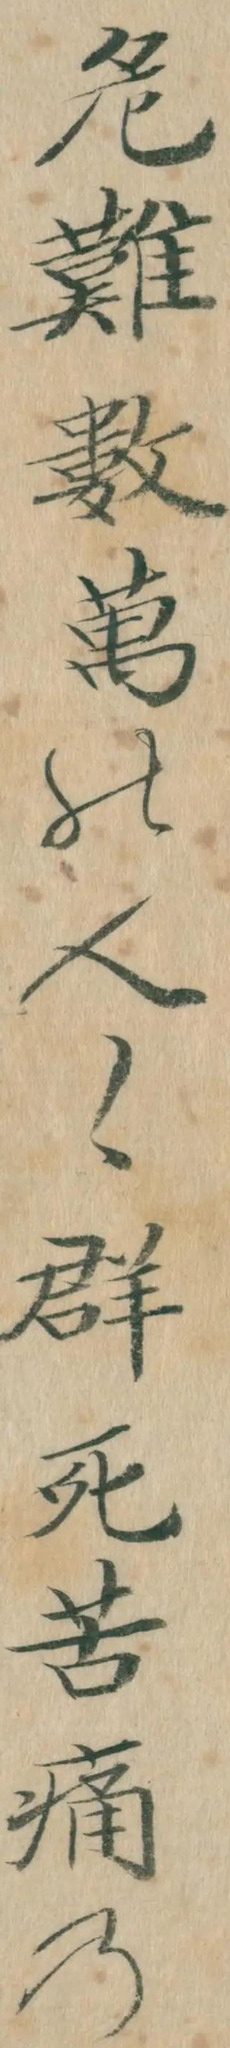危難数万の人〻群死苦痛の
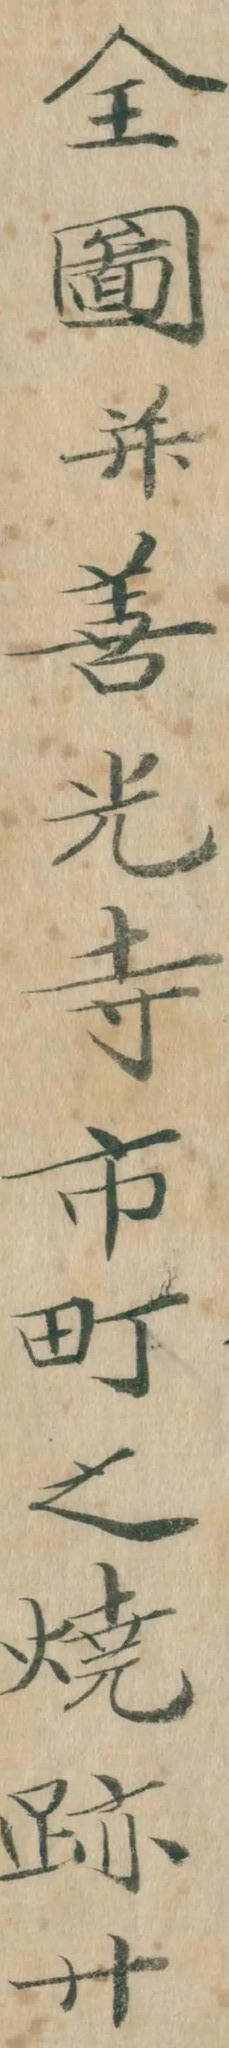全図并善光寺市町之焼跡廿
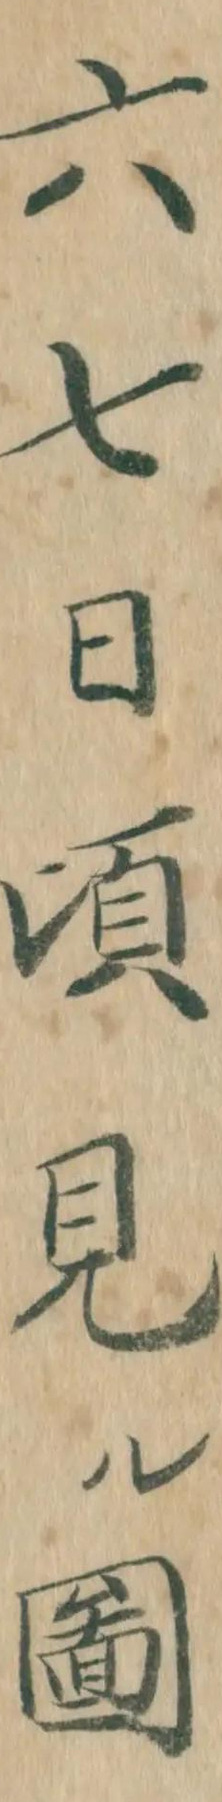六七日頃見ル図

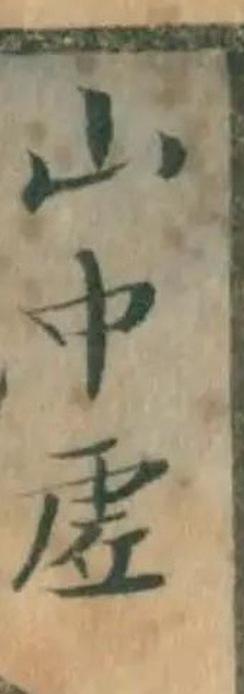山中虚
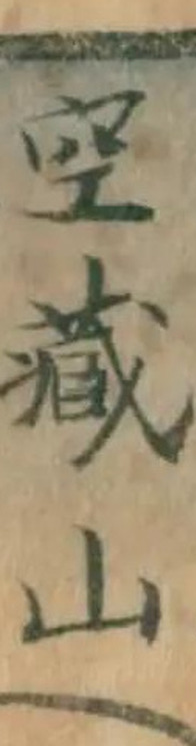空蔵山
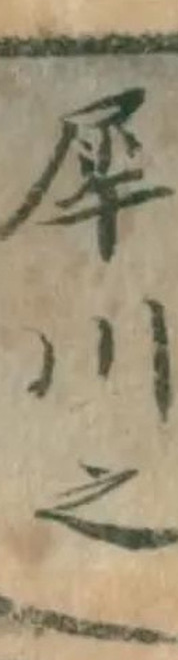犀川之
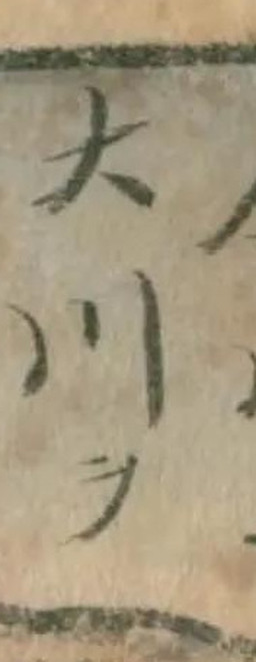大川ヲ
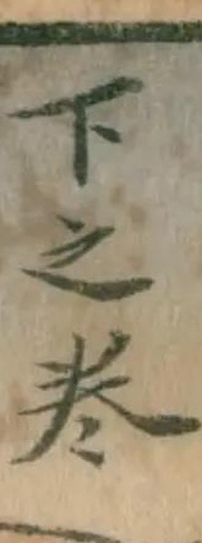下之巻
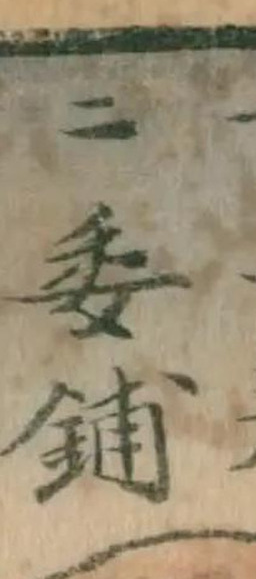ニ委鋪

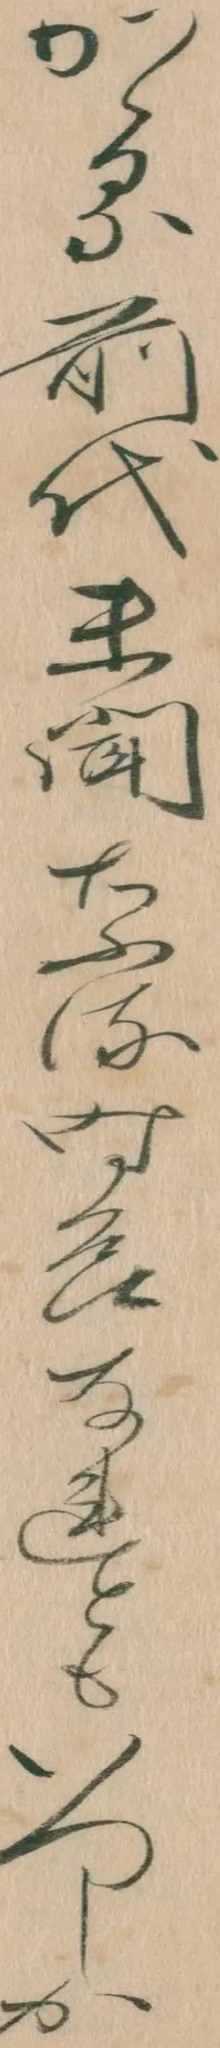かゝる前代未聞なる時節なれともいつしか
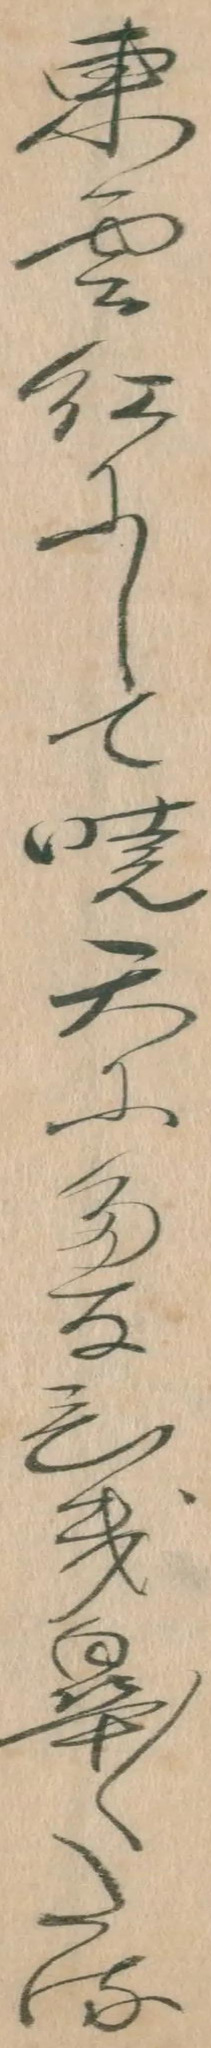東雲紅にして暁天にたなひき皐〳〵たる
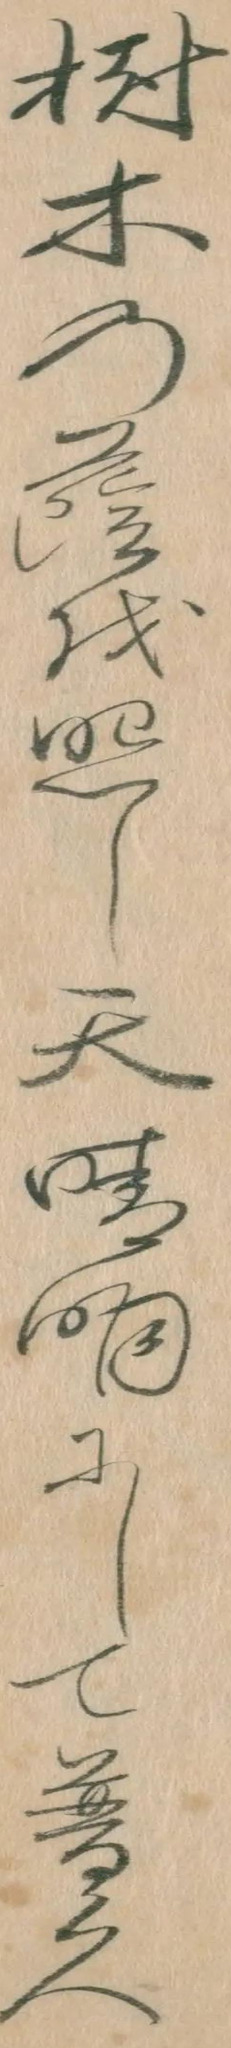樹木の蔭を照し天晴明にして普く
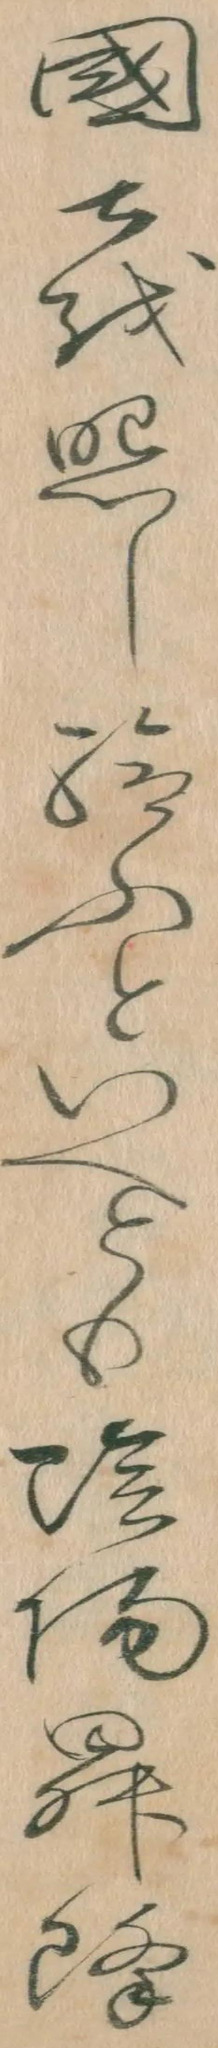国土を照し給ふといへとも陰陽昇降
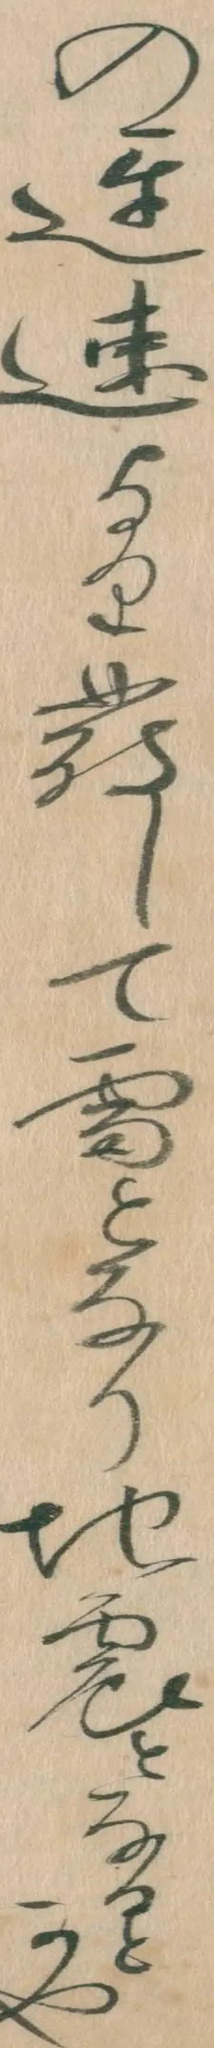の遅速より発して雷となり地震となるとかや
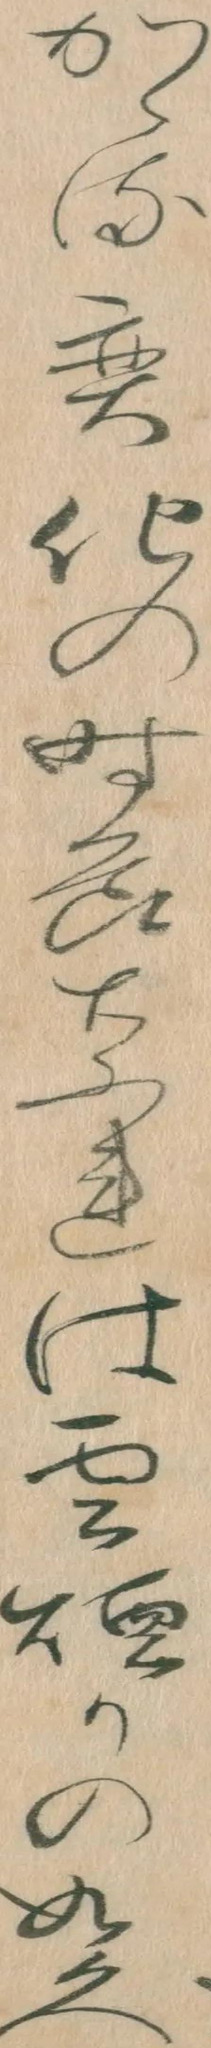かゝる変化の時節なれは雲煙りの如く
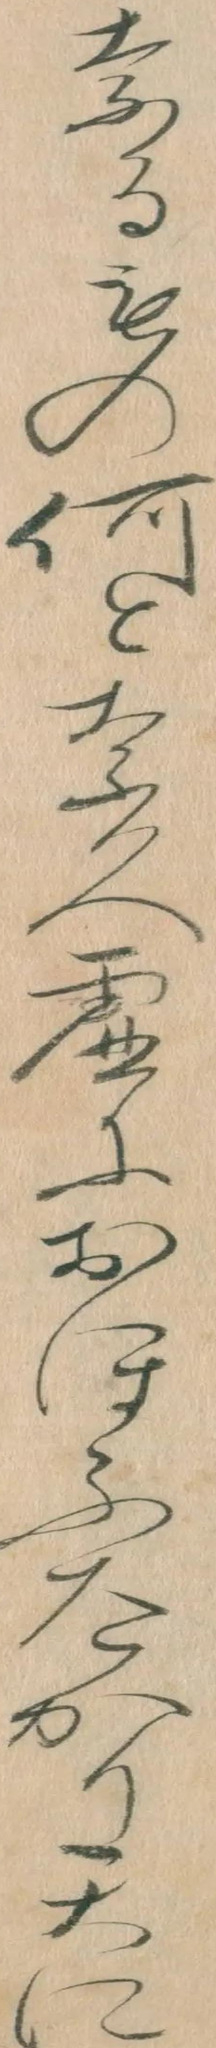なるもの何となく虚におほふたかり天に
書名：俗語之種. [4]
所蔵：国立国会図書館 National Diet Library, JAPAN
